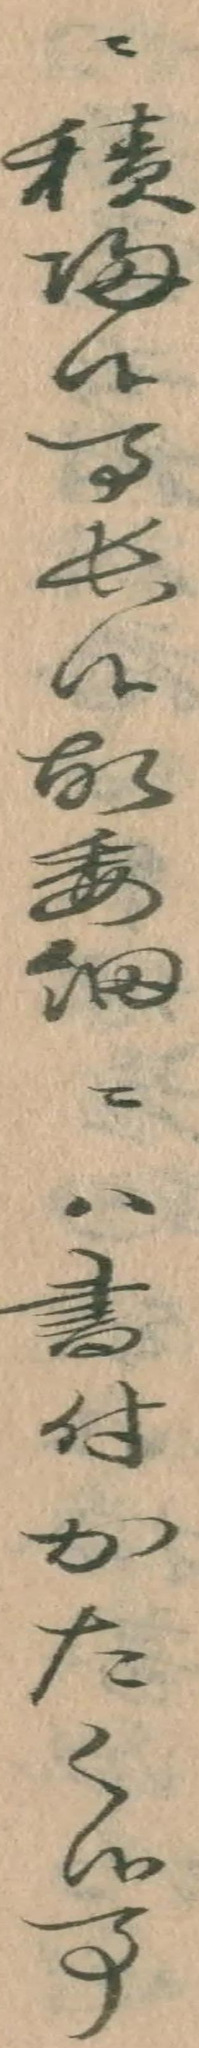に積帰候事長候故委細には書付かたく候事
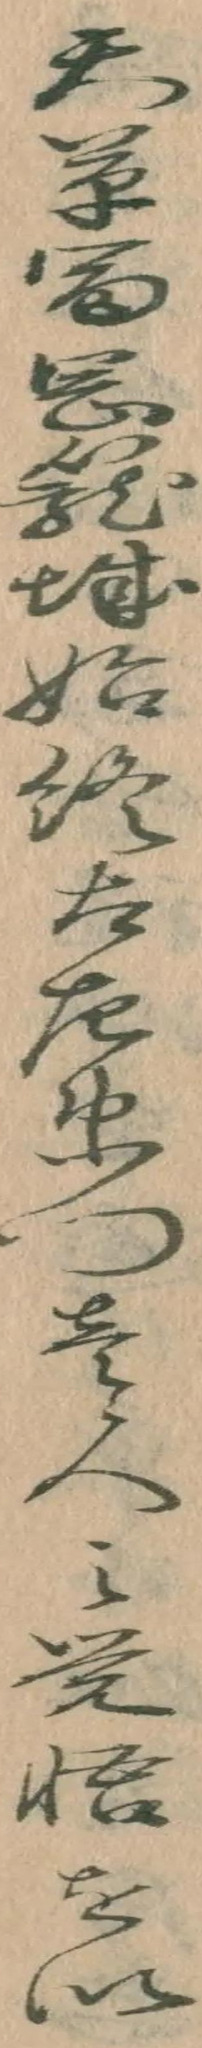天草冨岡籠城始終太左衛門壱人之覚悟を以
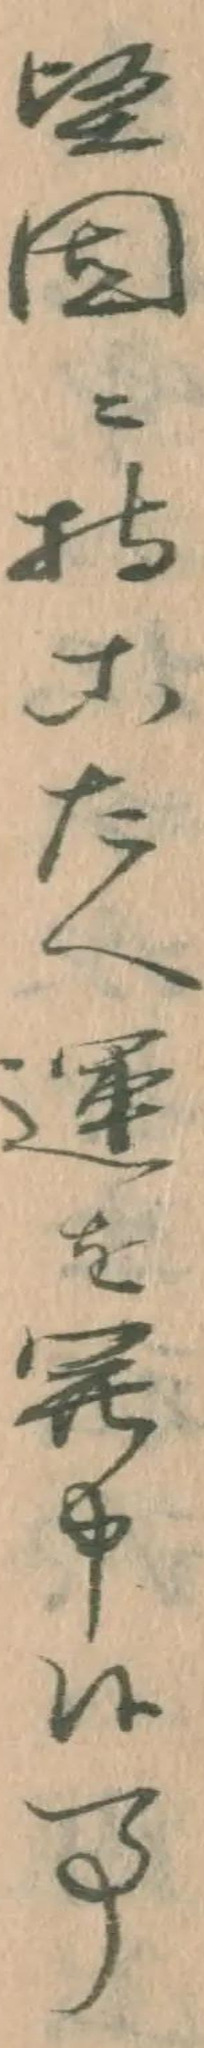堅固に持古たへ運を開申候事
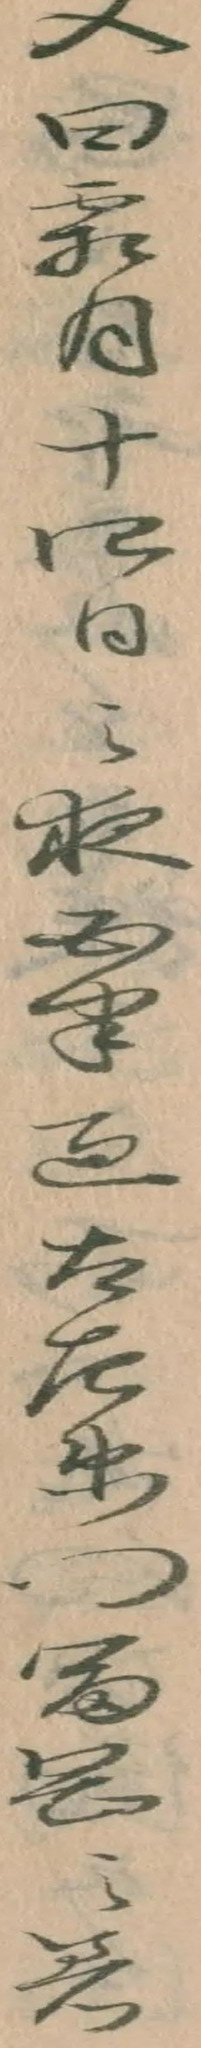又曰霜月十四日之夜五半過太左衛門冨岡之着
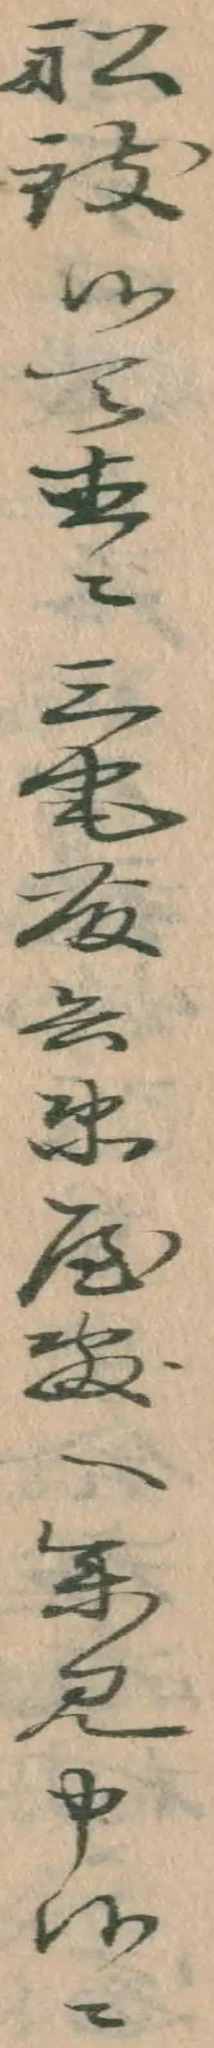舩致候て直に三宅藤兵衛屋敷へ参見申候に
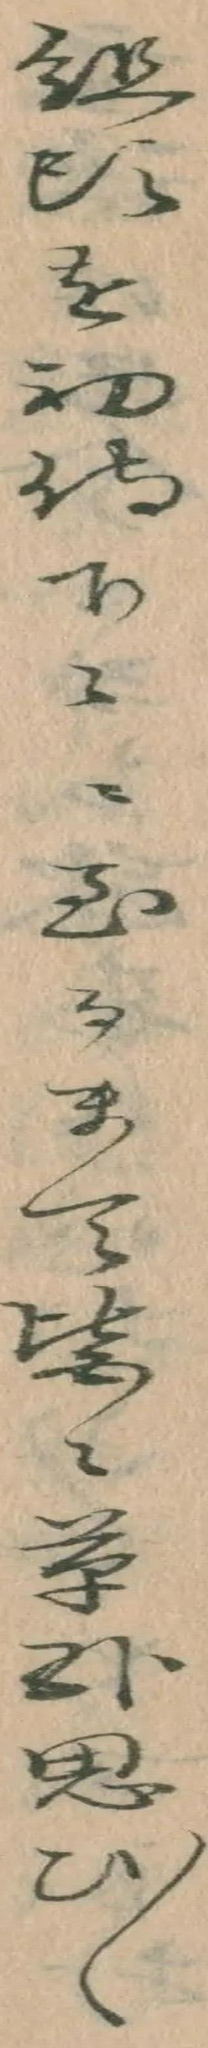組頭を初侍下々に至るまて皆々草臥思ひ〱
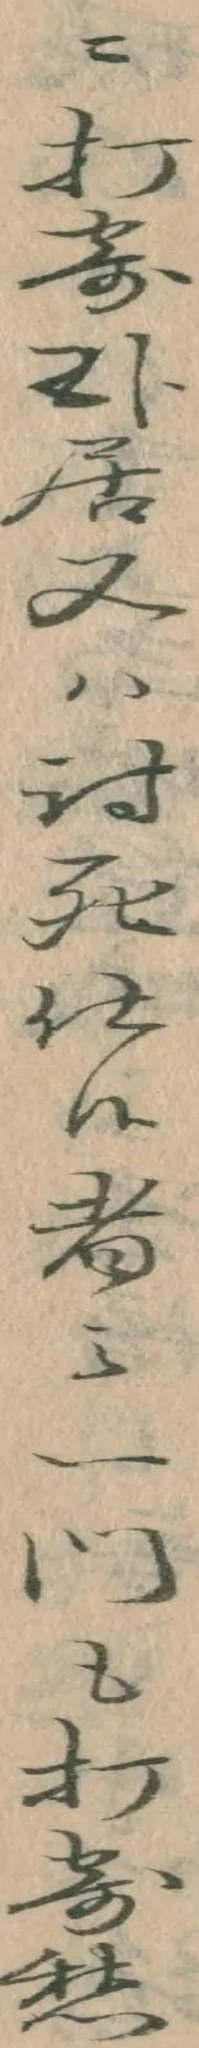に打寄臥居又は討死仕候者之一門も打寄愁
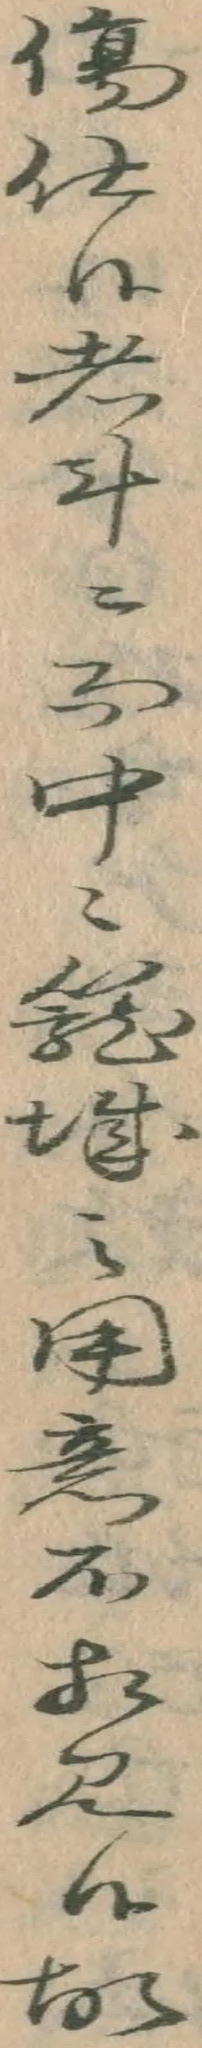傷仕候者斗に而中に籠城之用意不相見候故
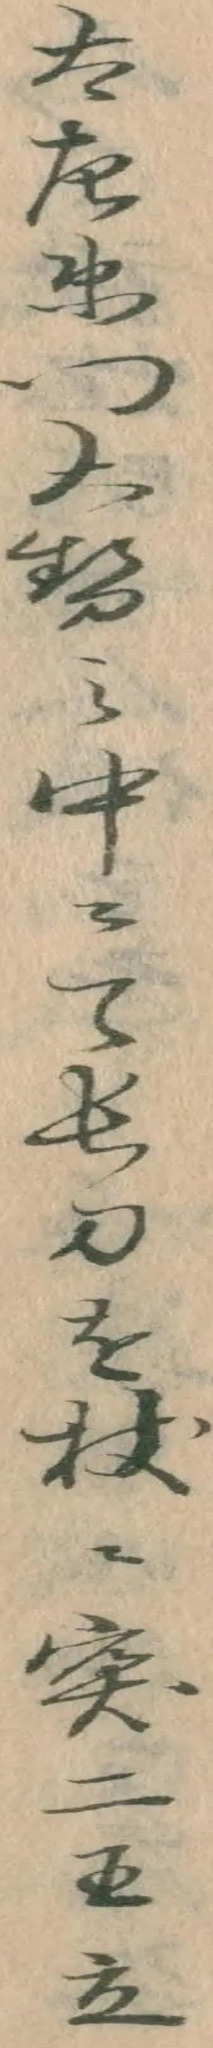太左衛門大勢の中にて長刀を杖に突二王立
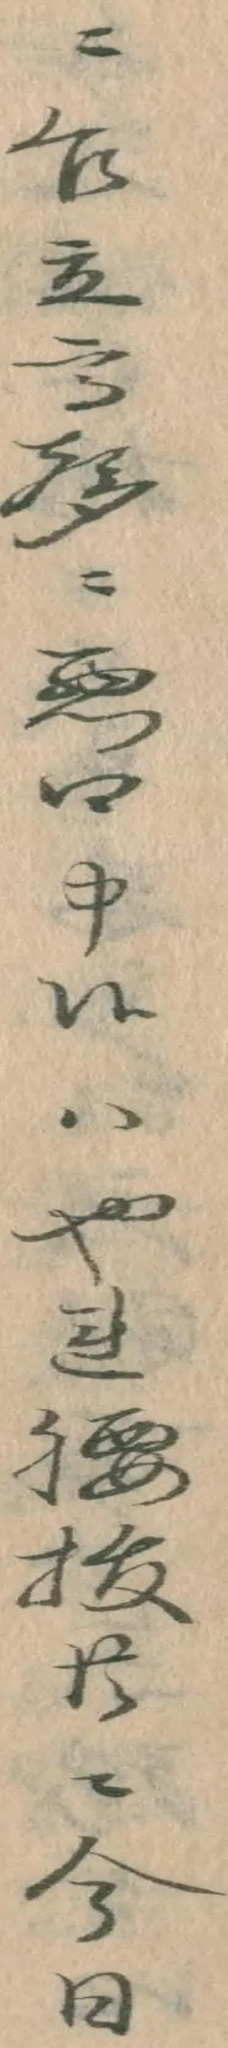に乍立高声に悪口申候はや連腰抜共に今日
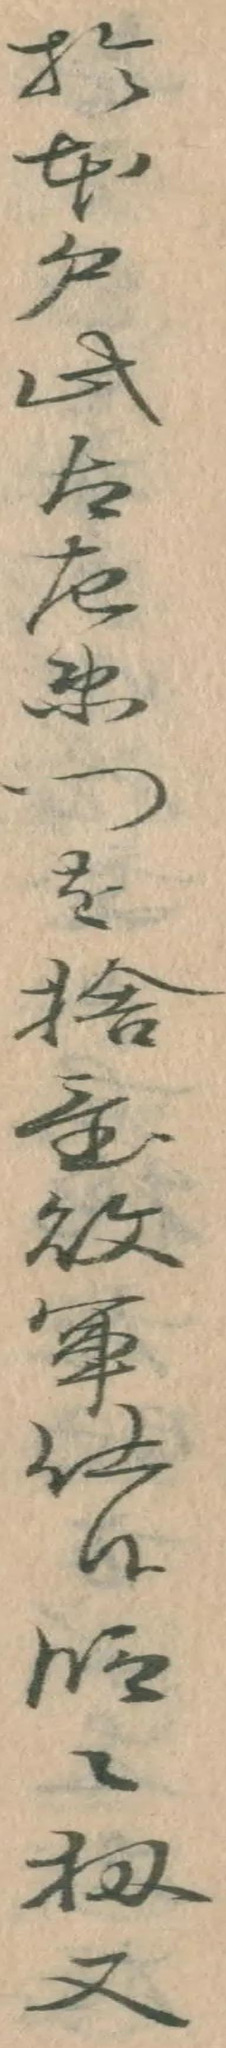於本戸此太左衛門を捨置敗軍仕候段に扨又
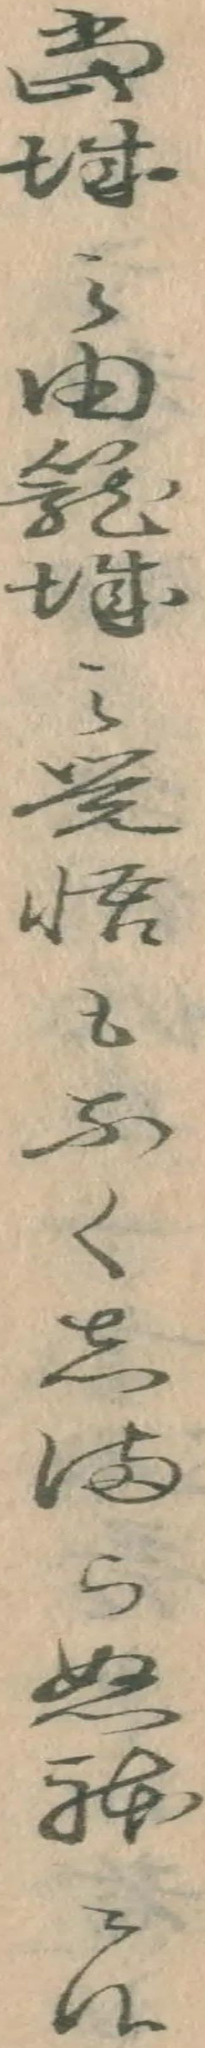当城之由籠城之覚悟もなく志満ら怒躰に候
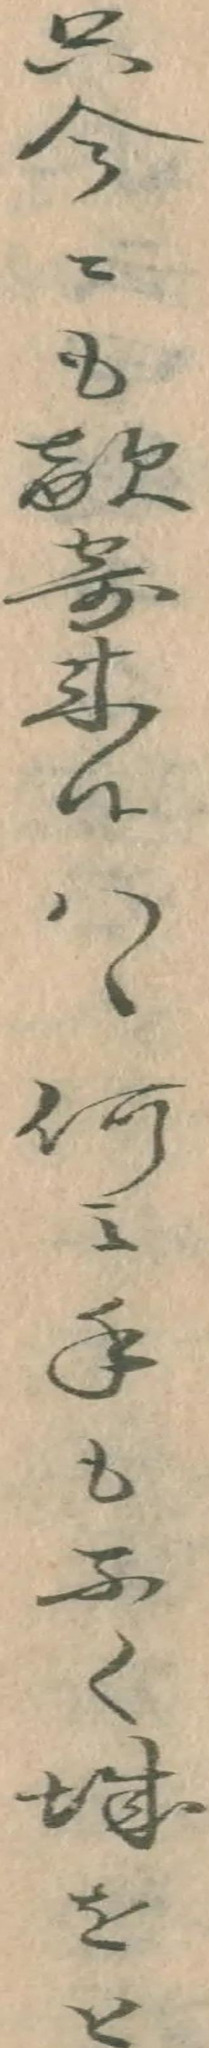只今にも敵寄来候はゝ何之手もなく城をと

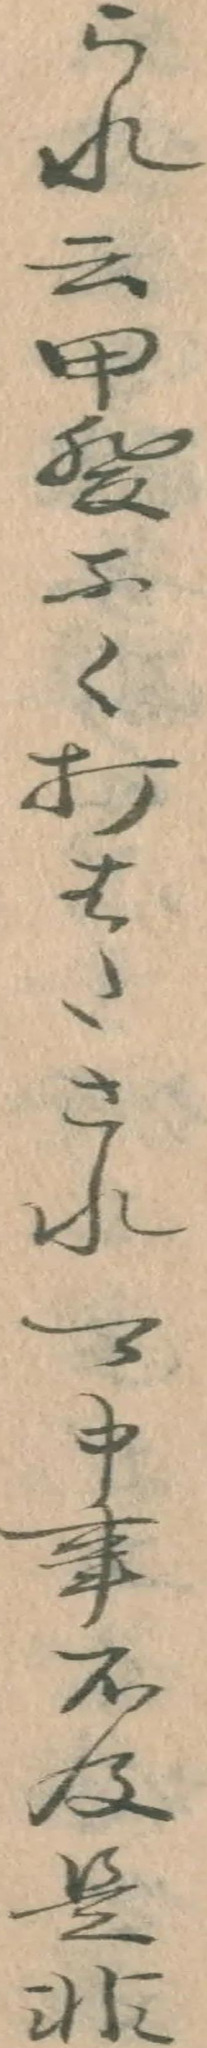られ云甲斐なく打はたされ可申事不及是非
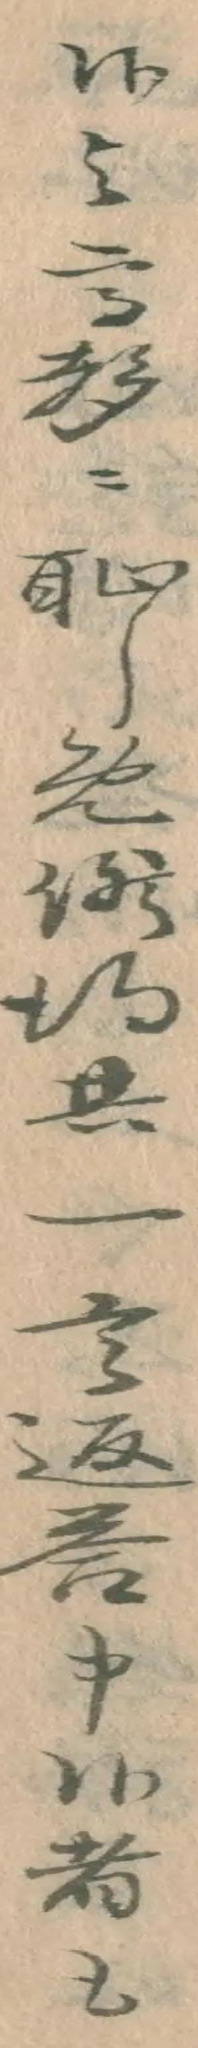候之高声に恥し免候得共一言返答申候者も
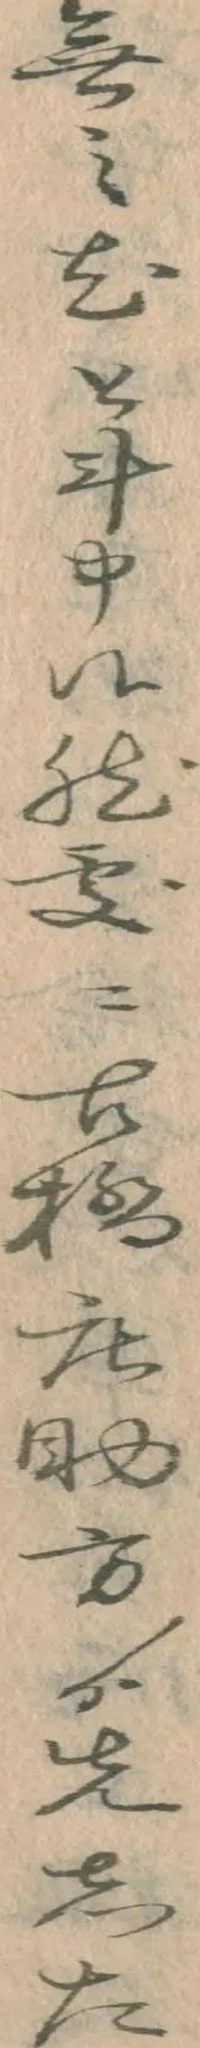無之尤と斗申候然處に古橋庄助方ゟ先志た
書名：切支丹御退治記 49巻. [2]
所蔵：国立国会図書館 National Diet Library, JAPAN
